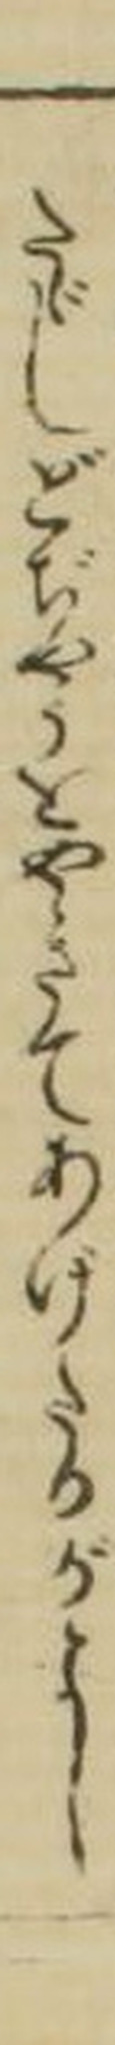たゞしどぢやうをやきてあげたるがよし
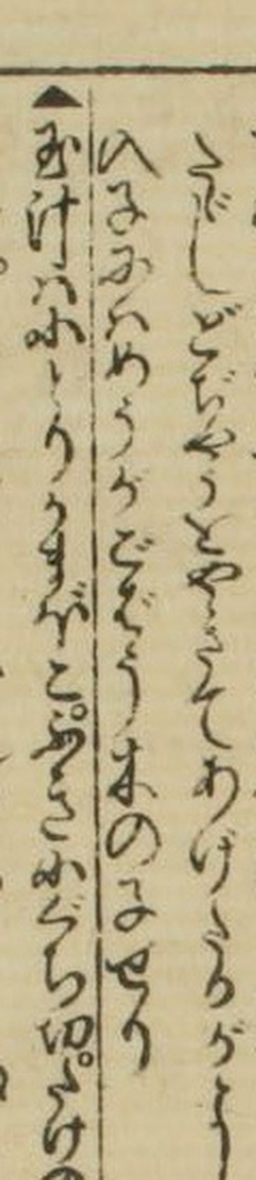入子にはめうがごばう木の子せり
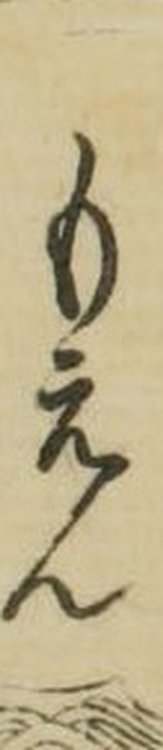もえん
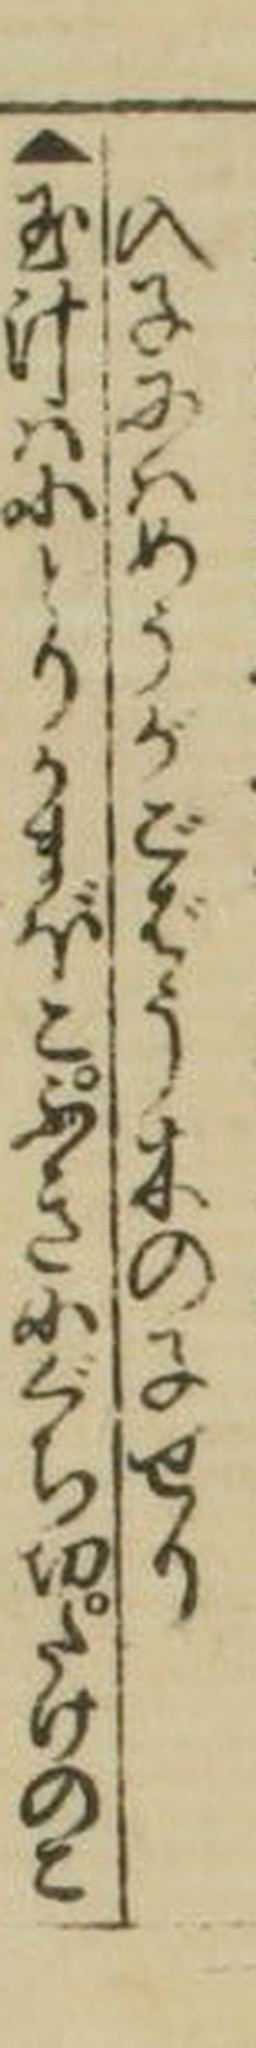▲玉汁は小とりかまぼこ。ふき小ぐち切。たけのこ
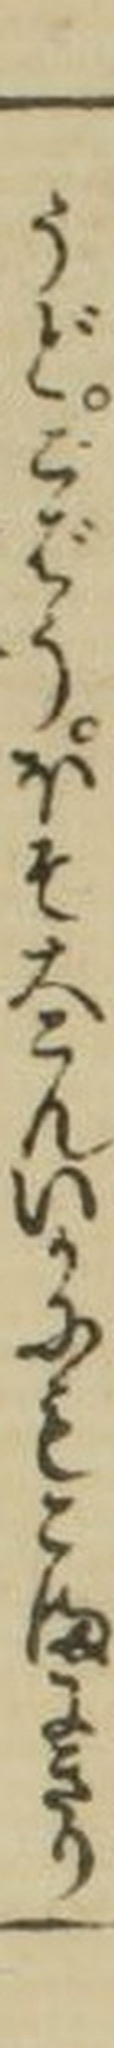うど。ごばう。ほそ大こんいかにもこまにきり
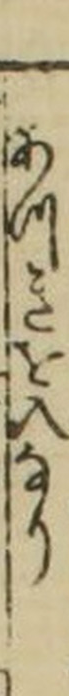あつきを入なり
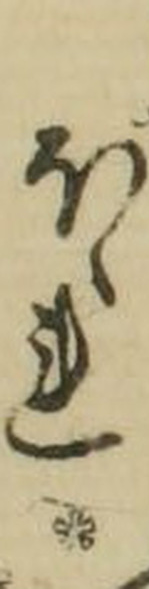ぼゝれ
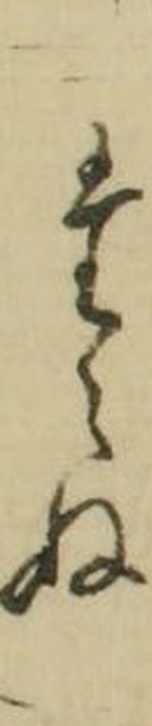たえぬ
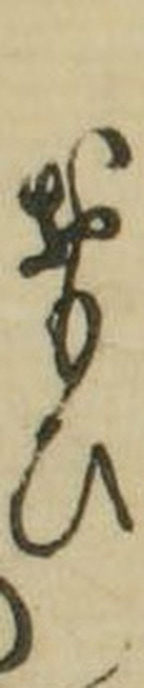おもひ
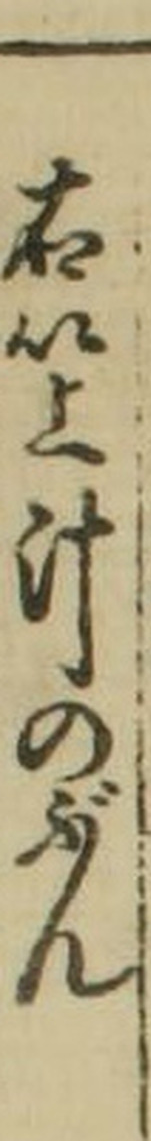右以上汁のぶん
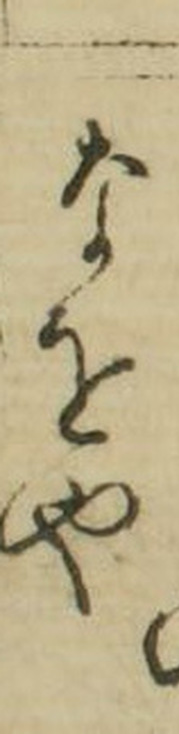なをや
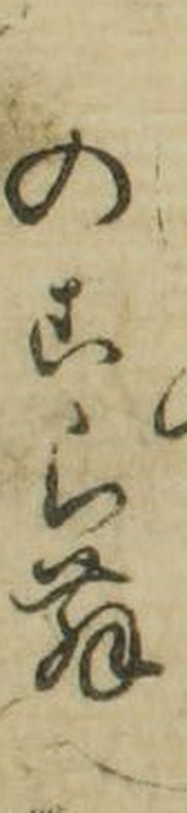のこらむ

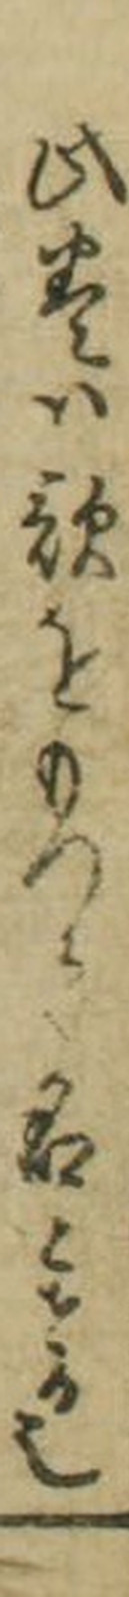此巻は歌をもつて名とせる也
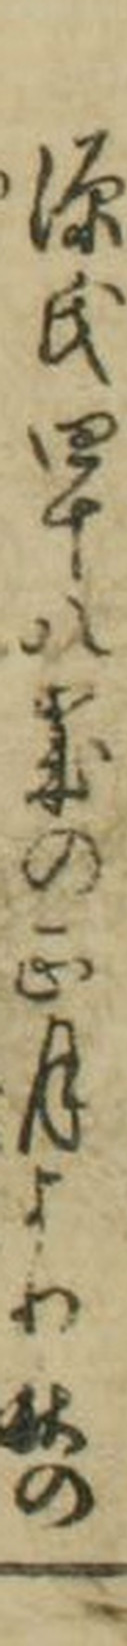源氏四十八歳の正月より秋の
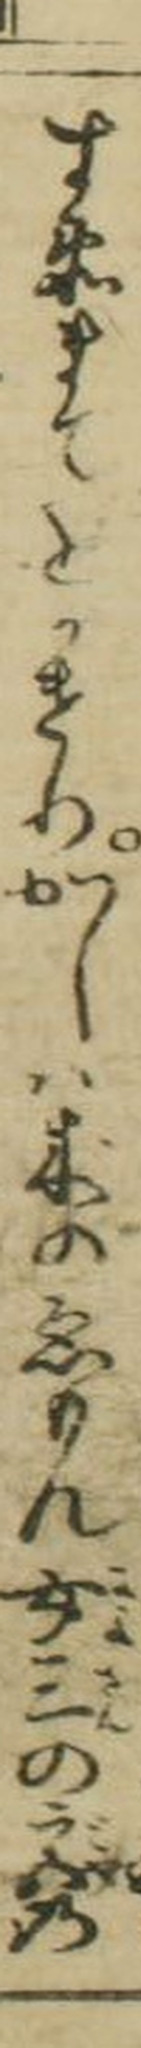すゑまてをかけり。かしはぎのゑもん女三の宮の
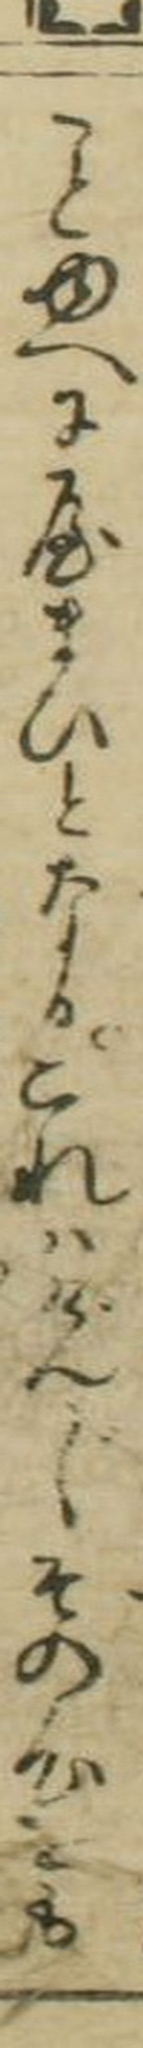ことゆへにやまひとなる。これはげんじその心をも
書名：女源氏教訓鑑
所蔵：東京学芸大学附属図書館
